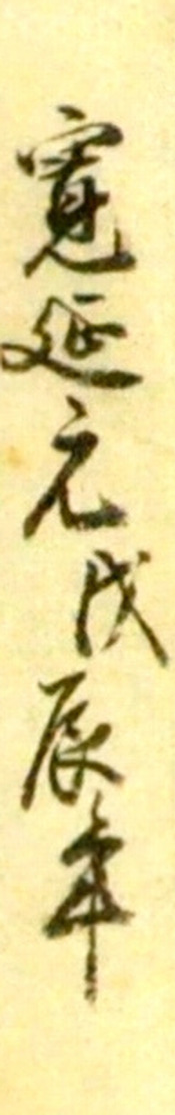寛延元戊辰年
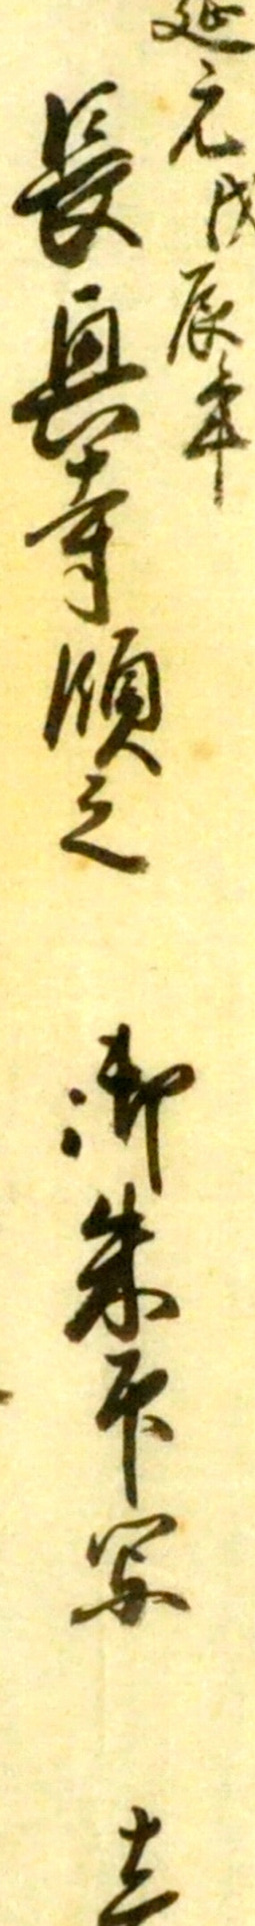長興寺領之御朱印写壱通

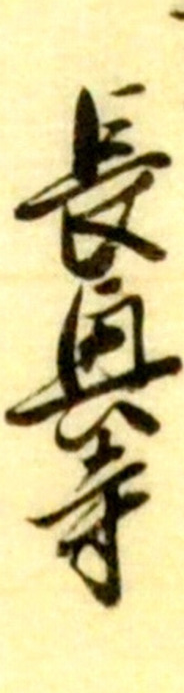長興寺

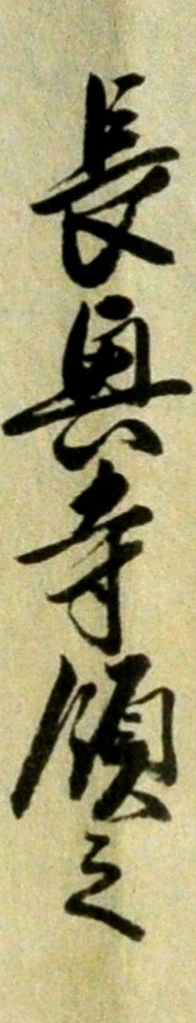長興寺領之
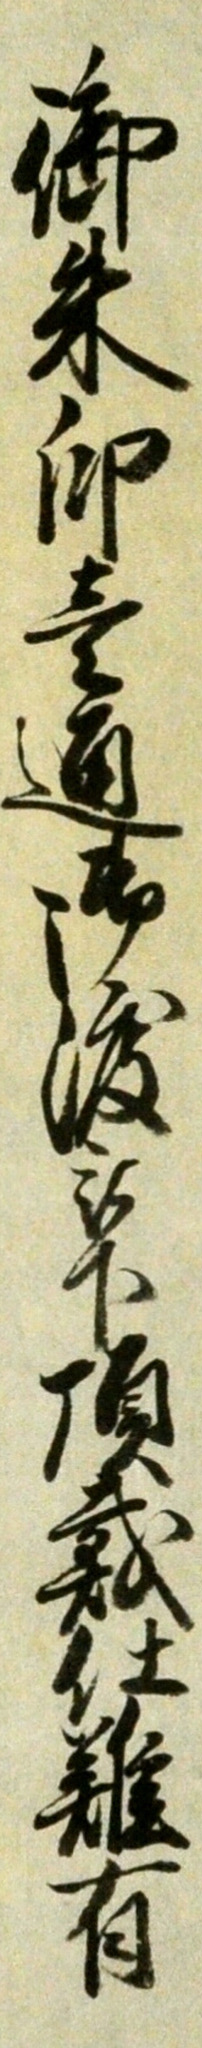御朱印壱通御渡被下頂戴仕難有
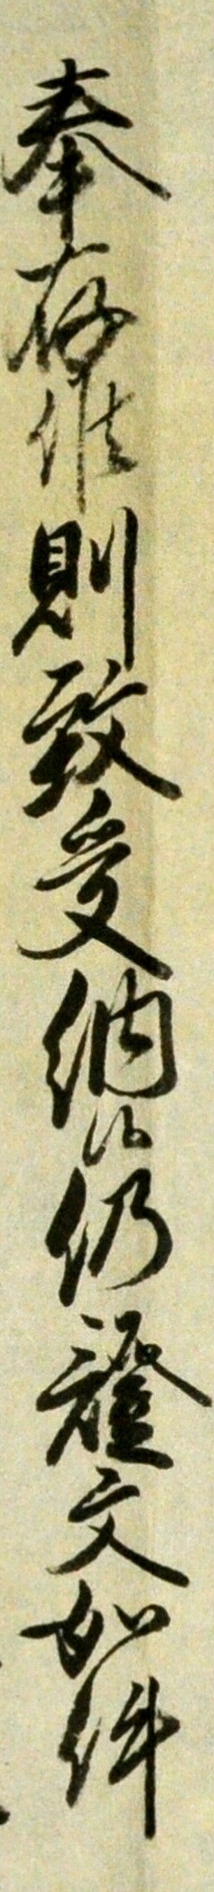奉存候則致受納候仍証文如件
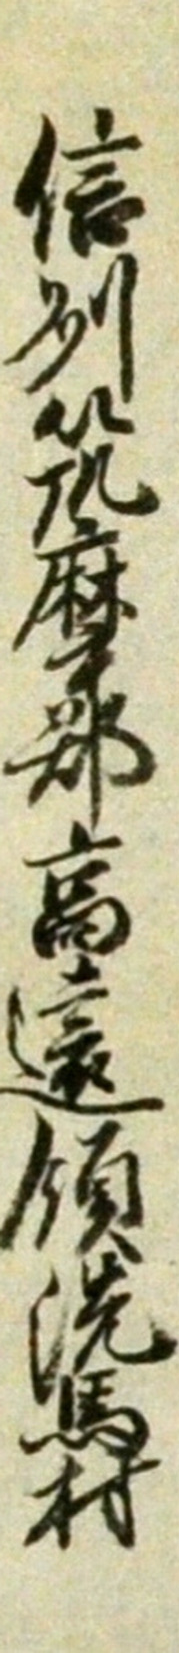信州筑摩郡高遠領洗馬村
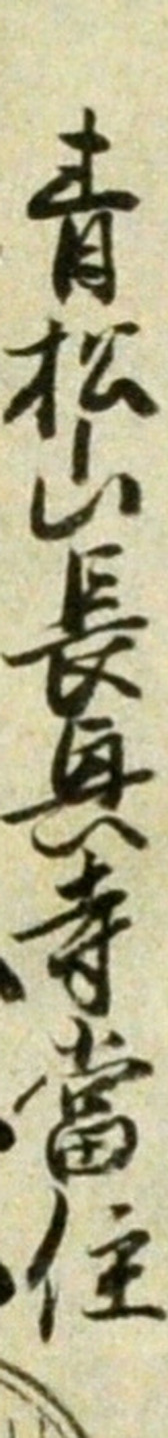青松山長興寺当住
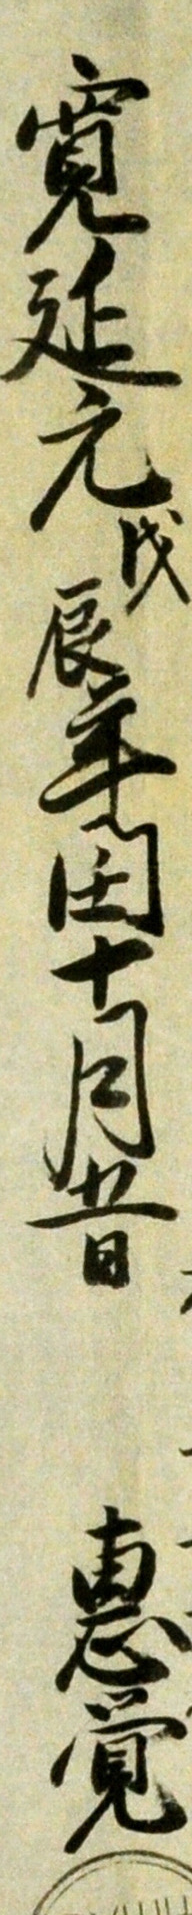寛延元戊辰年閏十月五日恵覚
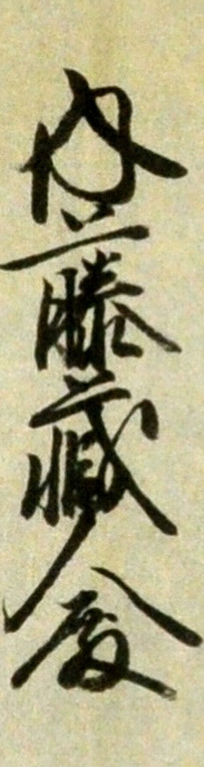内藤蔵人殿
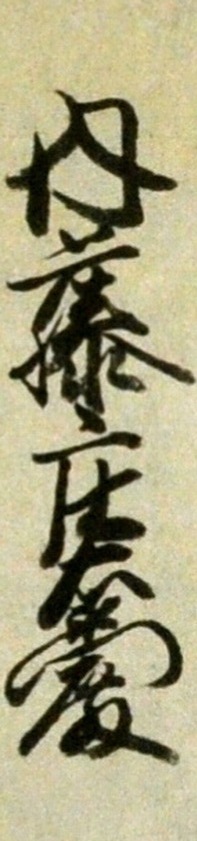内藤庄右衛門殿
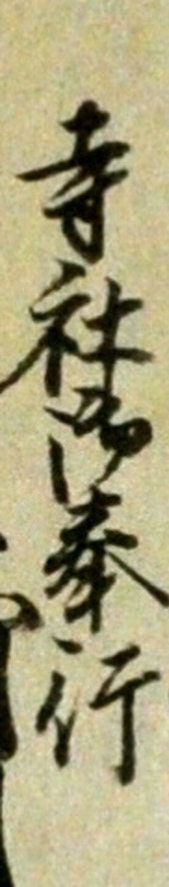寺社御奉行
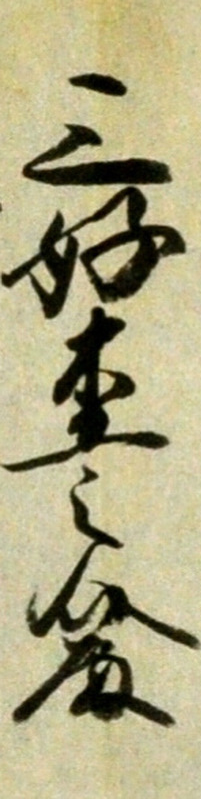三好杢之介殿
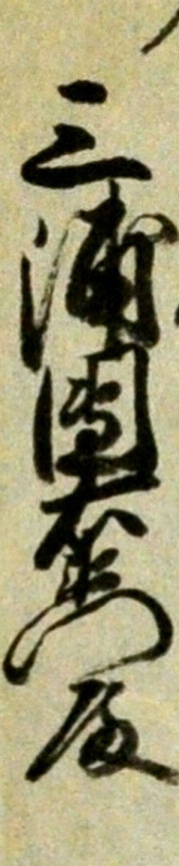三浦団右衛門殿

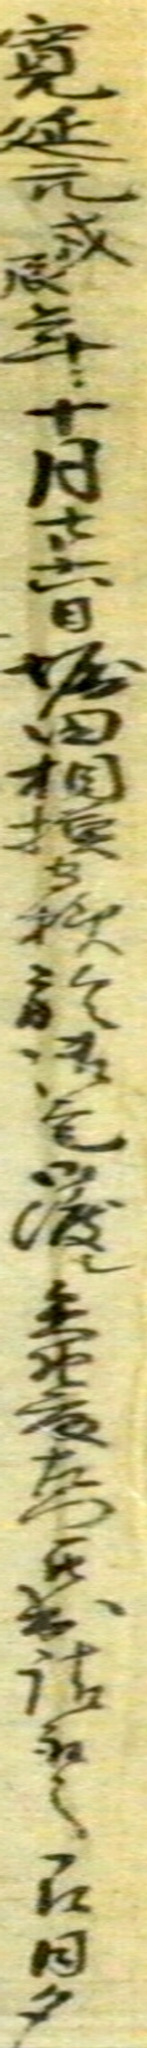寛延元戊辰年十月廿六日堀田相模守様於御宅御渡シ矢野藤左衛門罷出請取之即日夕本書高遠江
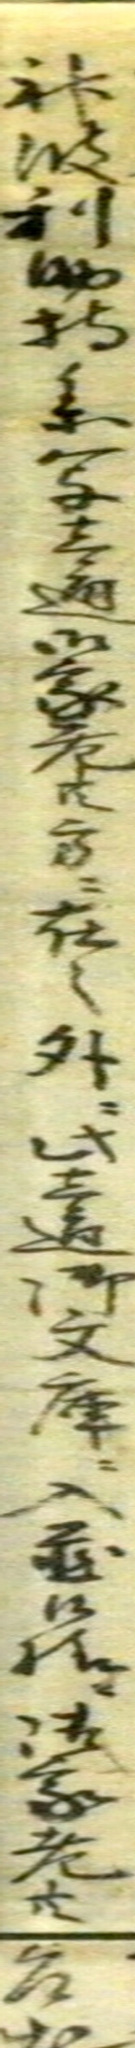神波利助持参写壱通御家老共方ニ在之外ニ此壱通御文庫ニ入置候様ニ御家老共差出之
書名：証文
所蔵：伊那市立高遠町図書館・合同会社AMANE
